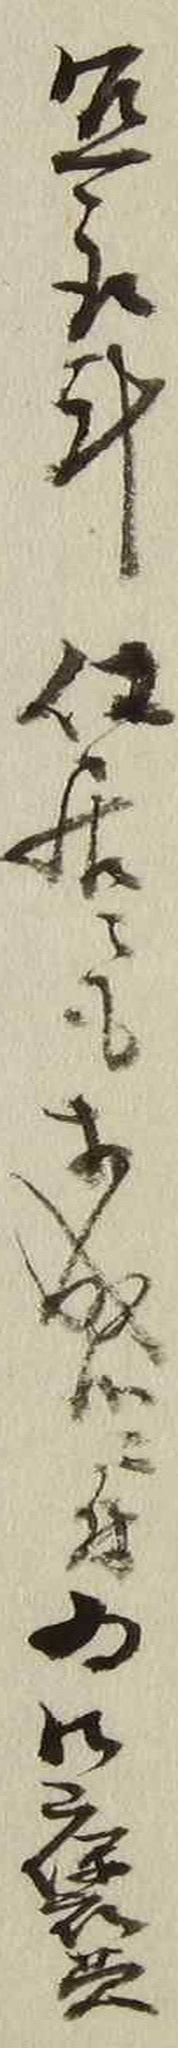宜取計仕候ニも相成候ニ付為御褒美
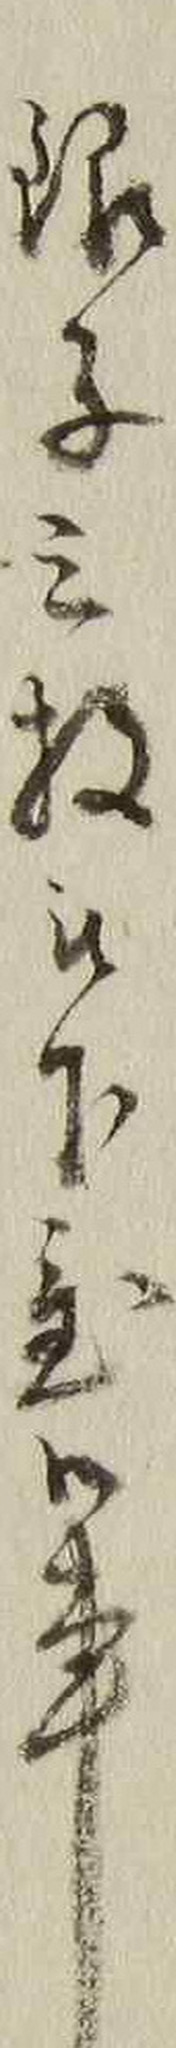銀子三枚被下置候事
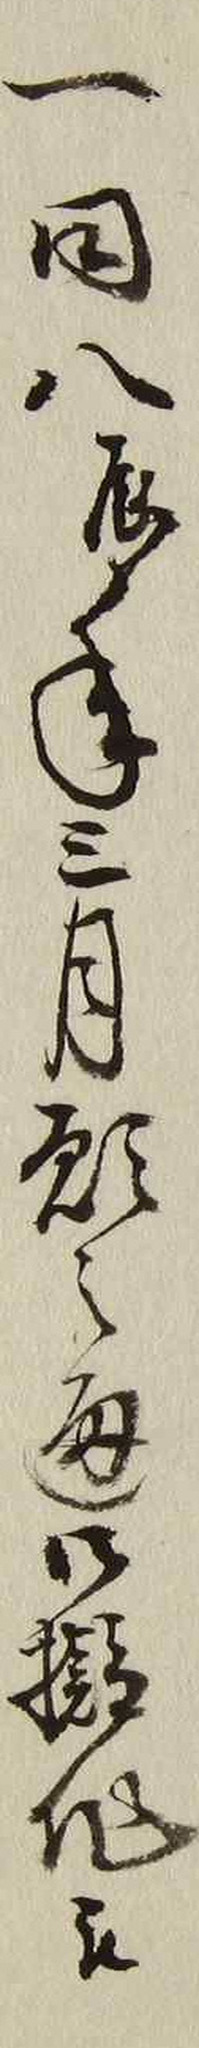一同八辰年三月願之通御擬作被
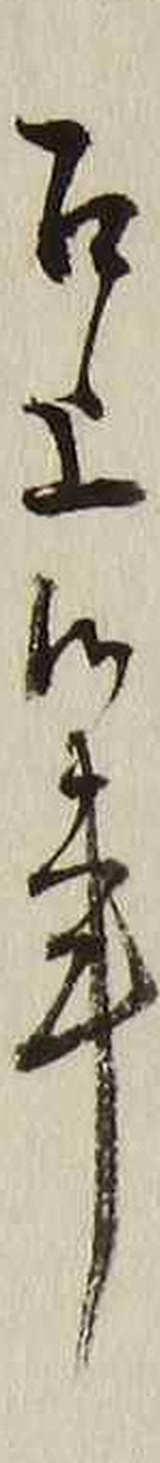召上候事
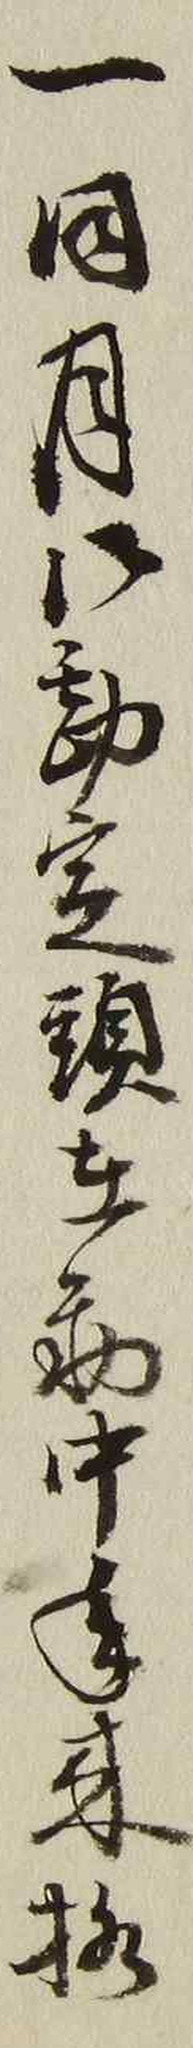一同月御勘定頭在勤中年来格
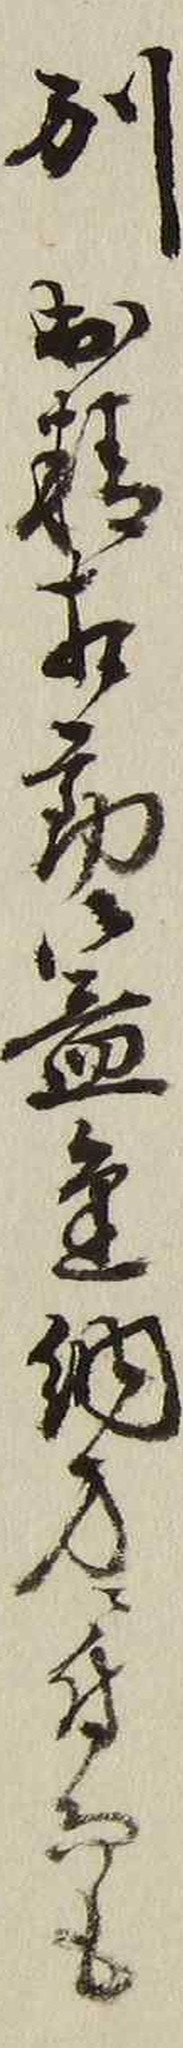別出精相勤御益金納方ニ付而も
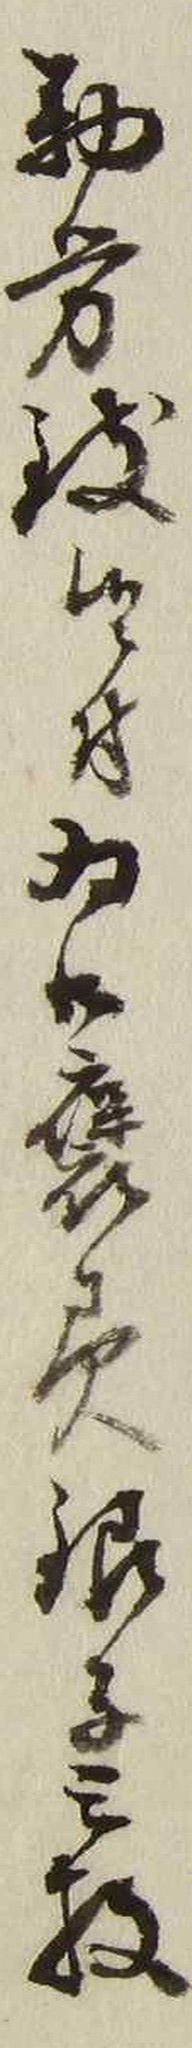勤労致候ニ付為御褒美銀子三枚

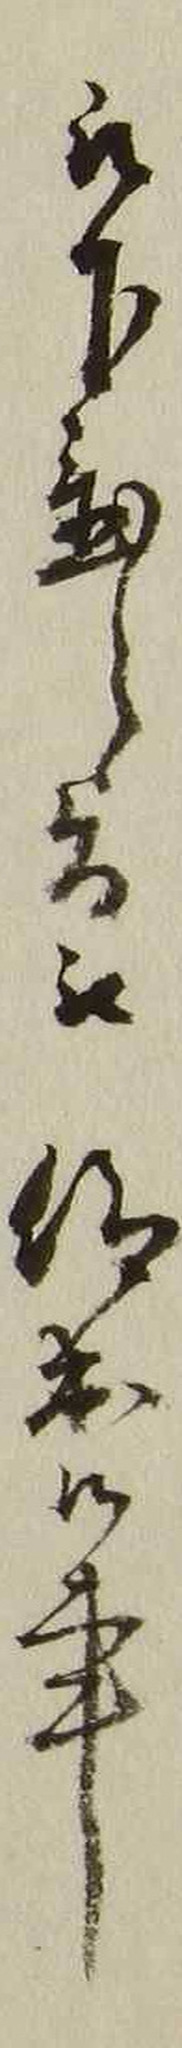被下置候旨被仰出候事
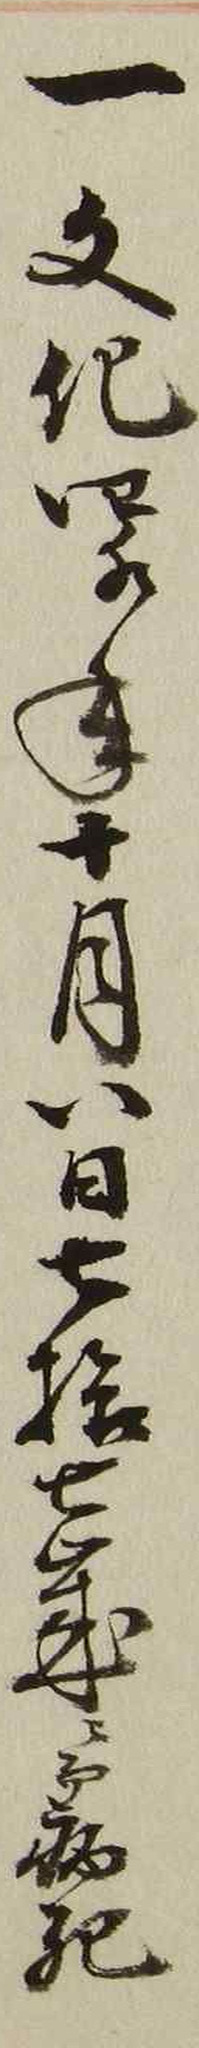一文化四卯年十月八日七拾七歳ニ而病死
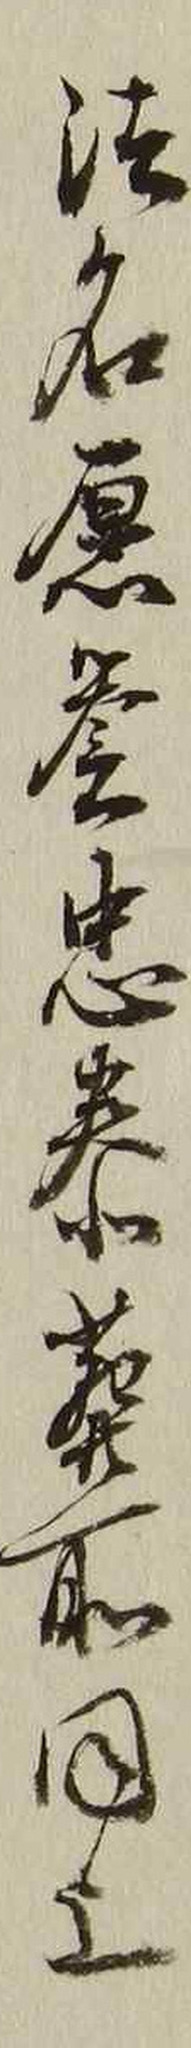法名愿誉忠泰葬所同上
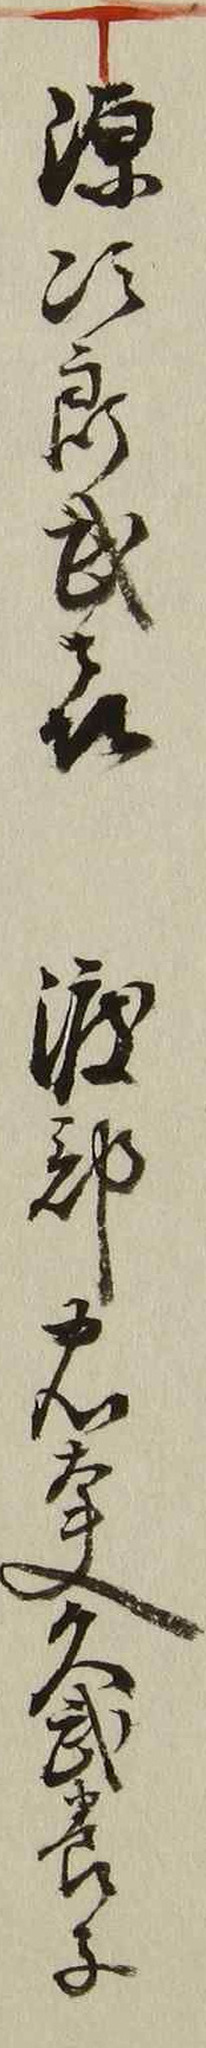源次郎武喜渡部忠太夫久武養子
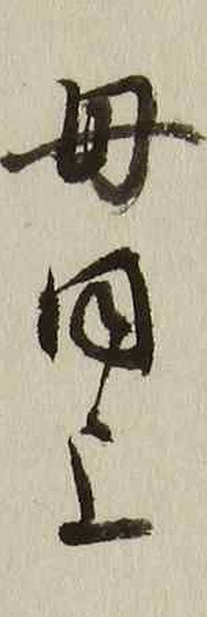母同上
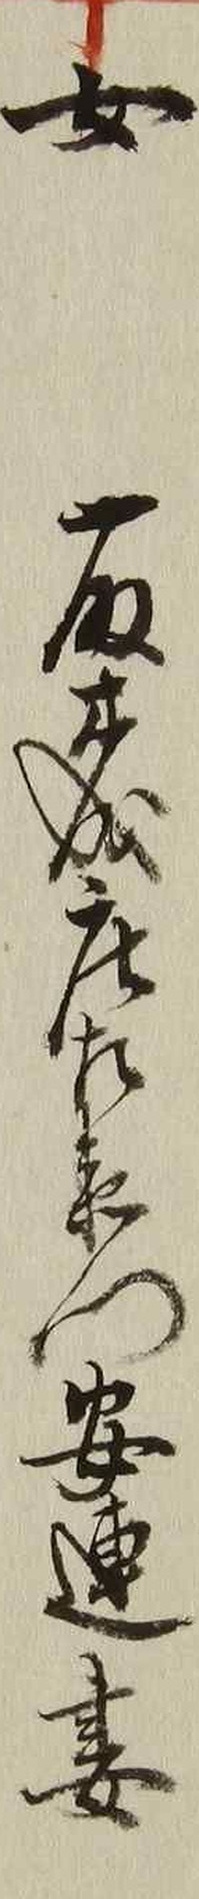女藤森庄左衛門安連妻
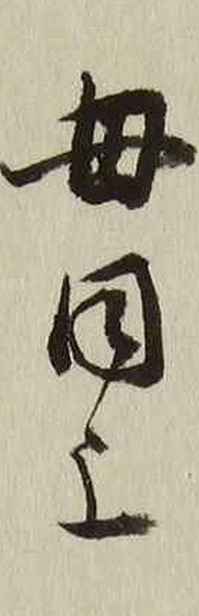母同上
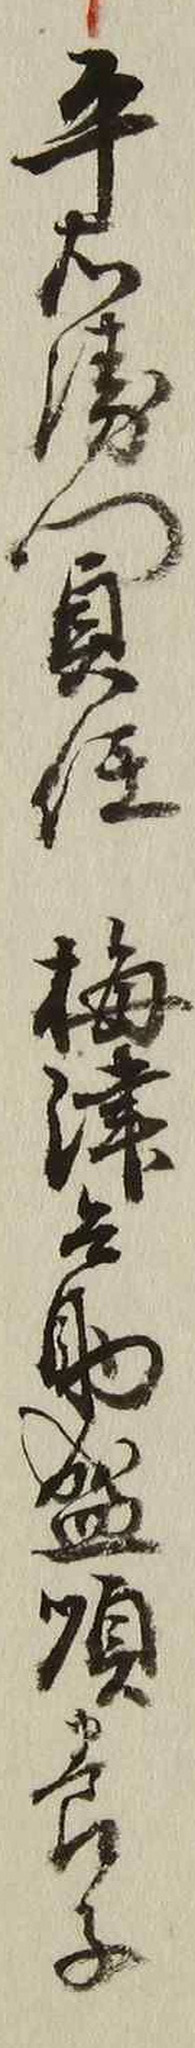平右衛門貞住梅津兵助盛順養子
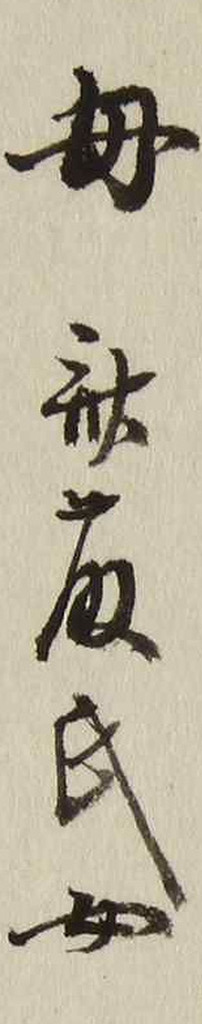母斎藤氏女
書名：諸士系譜　巻之36　は之部4
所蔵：会津若松市立会津図書館
